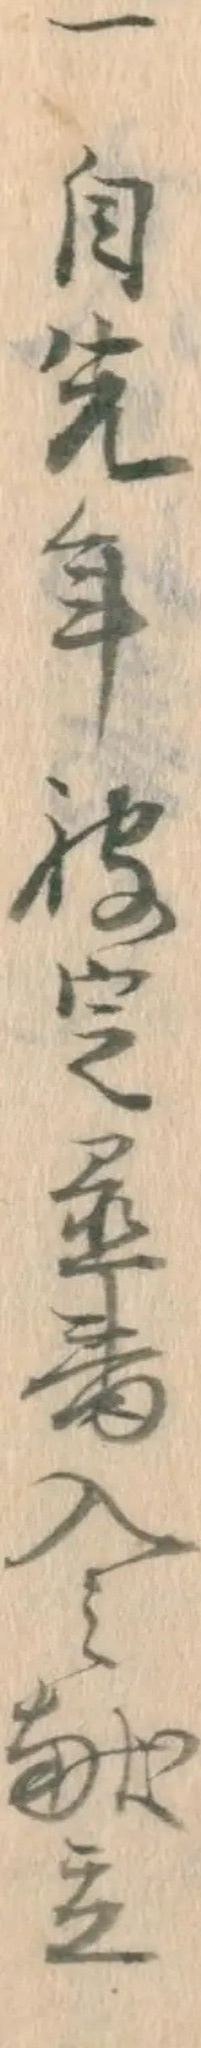一自先年被定置番入之献立
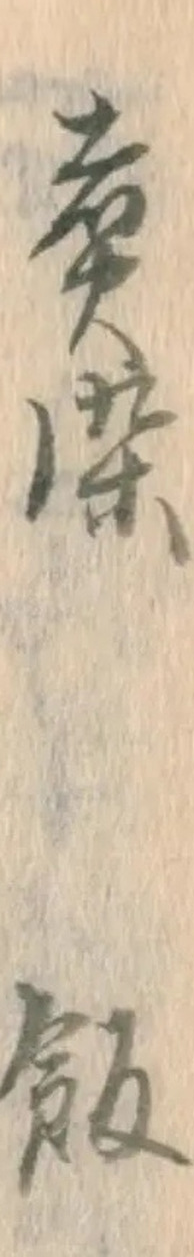煮染飯
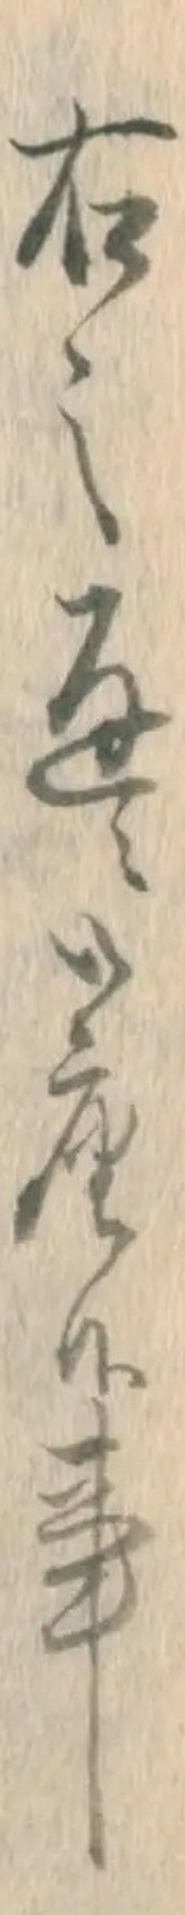右之通ニ御座候事
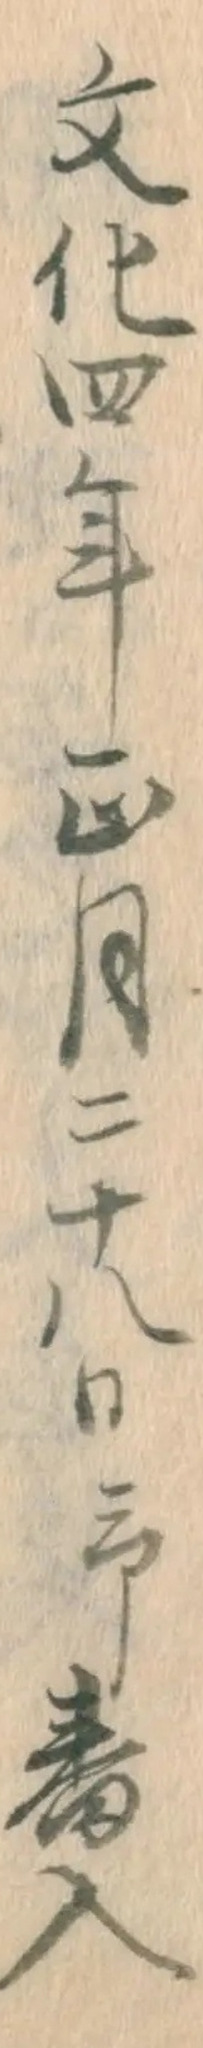文化四年正月二十八日予番入
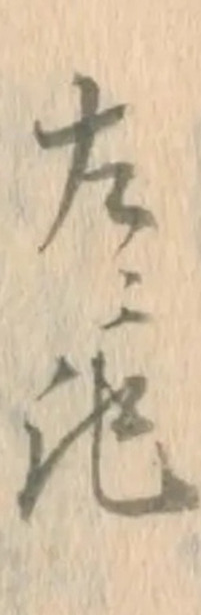左ニ記
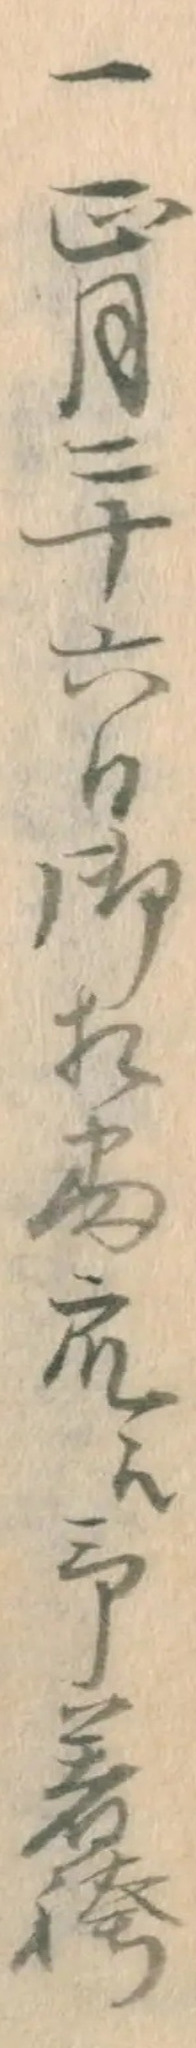一正月二十六日御相番衆え予着袴

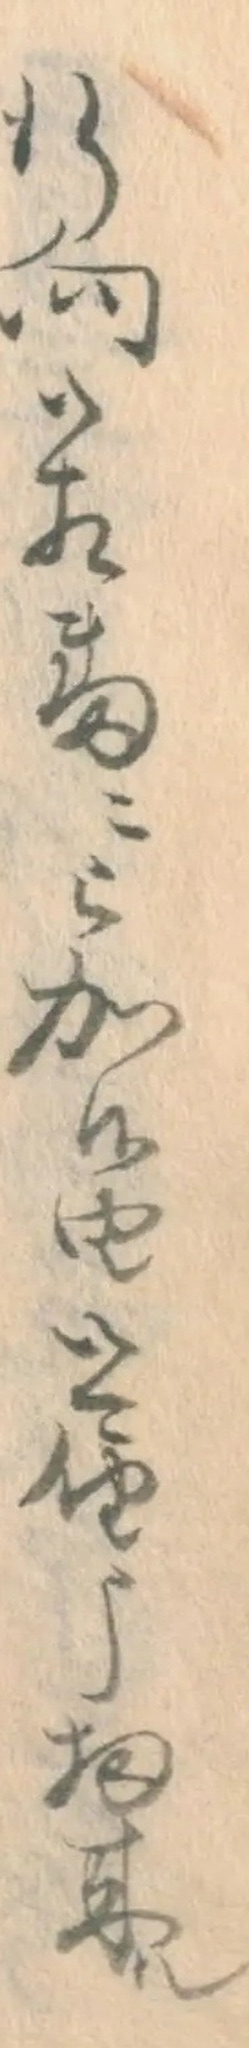行向御相番ニ被加候由御届申扨来ル
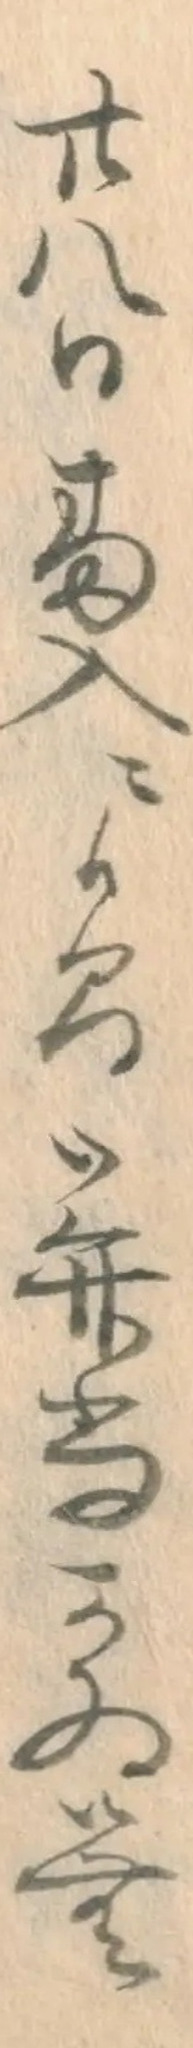廿八日番入ニ候間御弁當可為候其
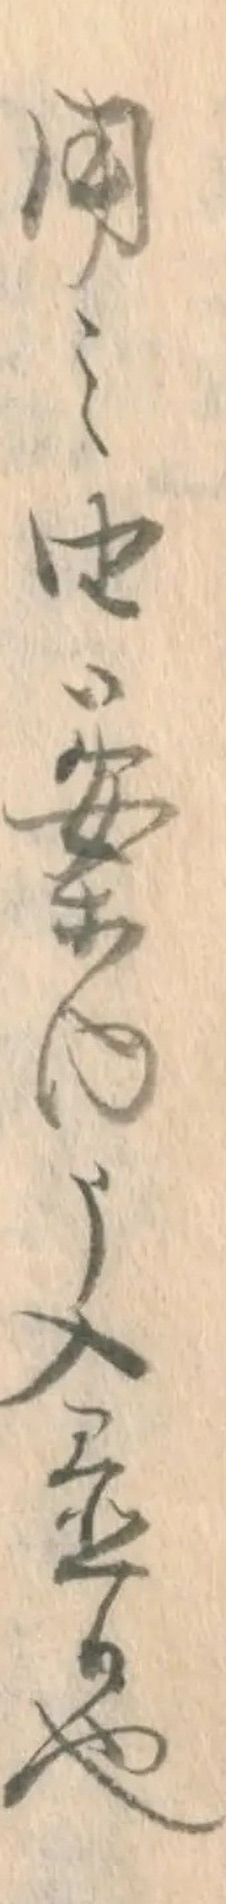用之由御案内申入置候也
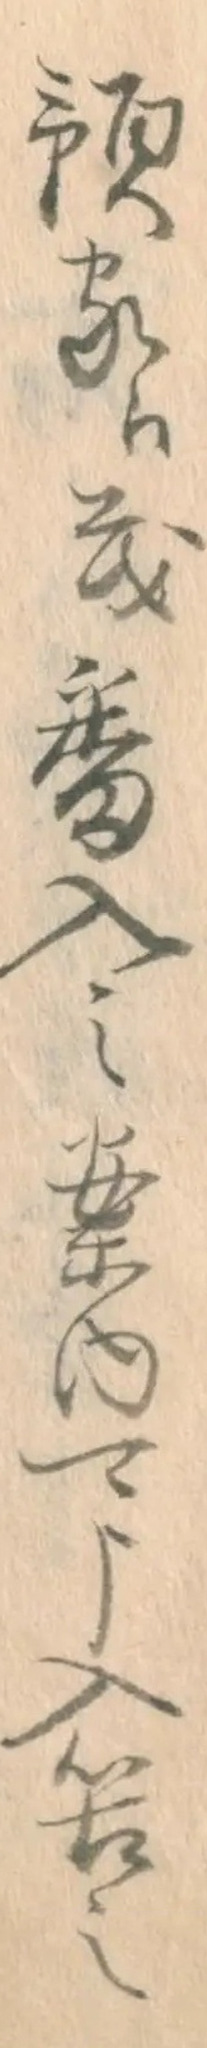預家えも番入之案内可申入筈之
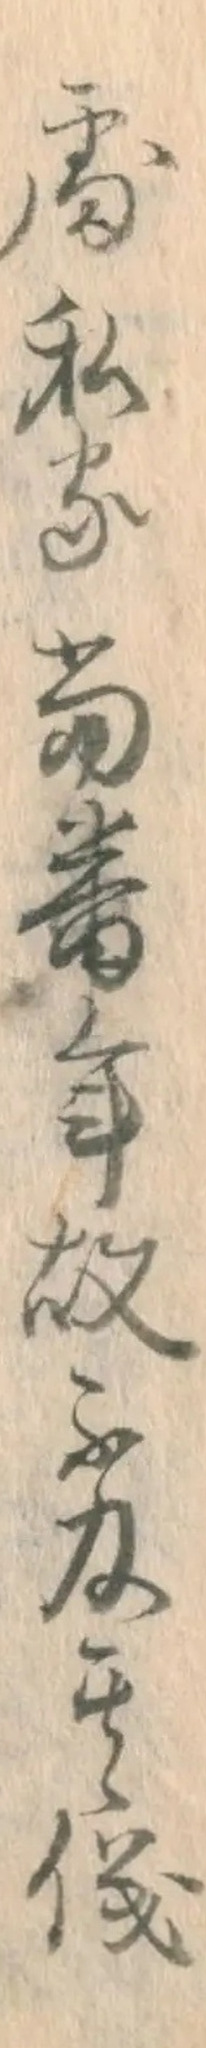處私家當番年故不及其儀
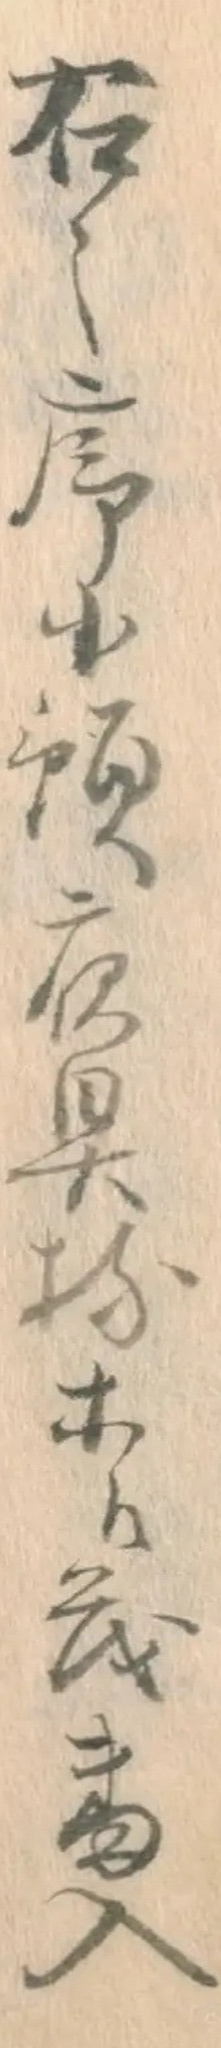右之序小願夜具持等えも番入
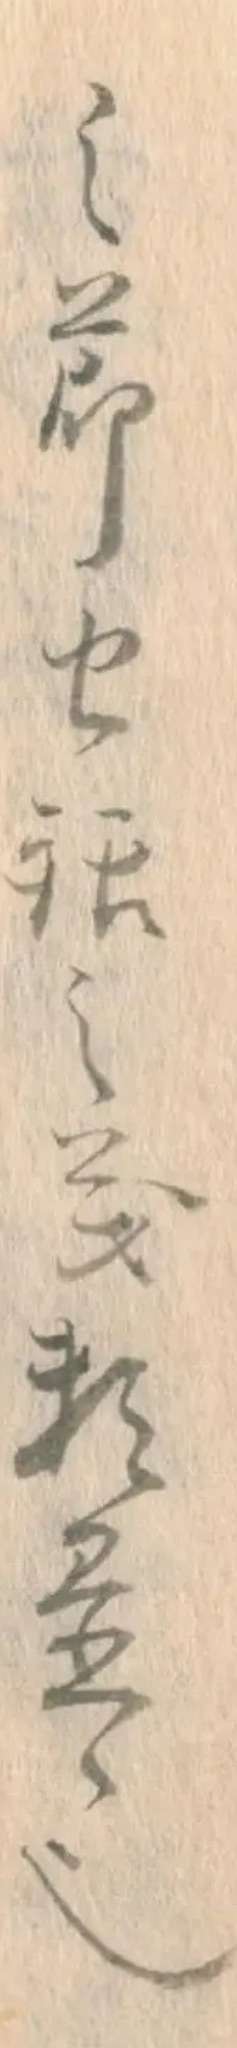之節世話之義頼置候也
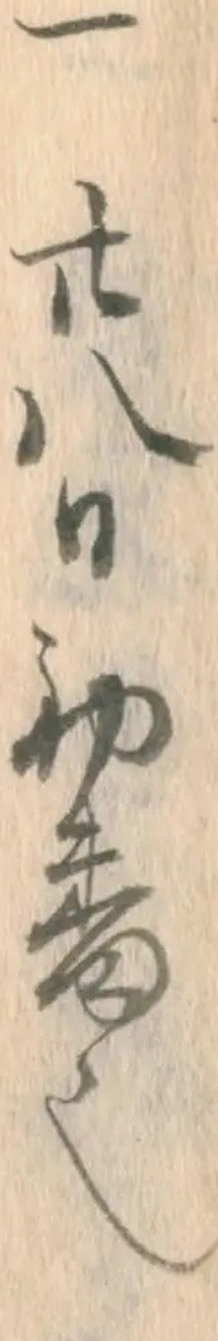一廿八日初番也
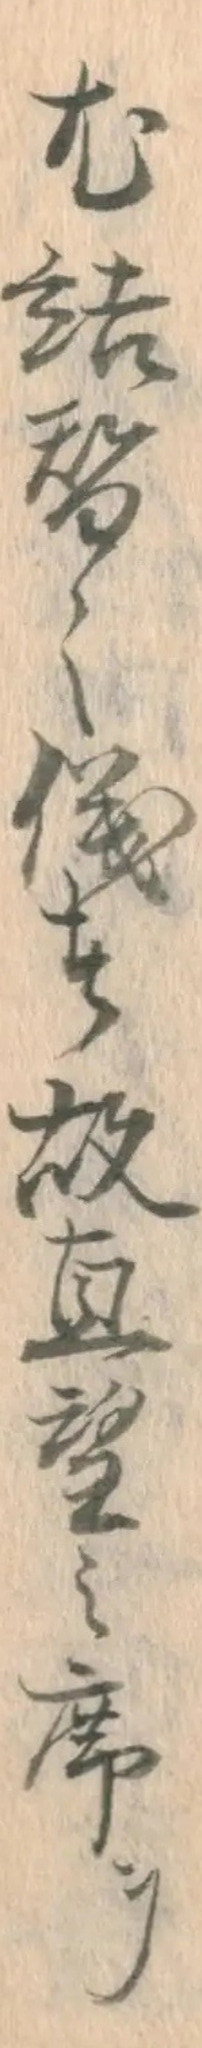尤詰替之儀は故直望之席ヲ
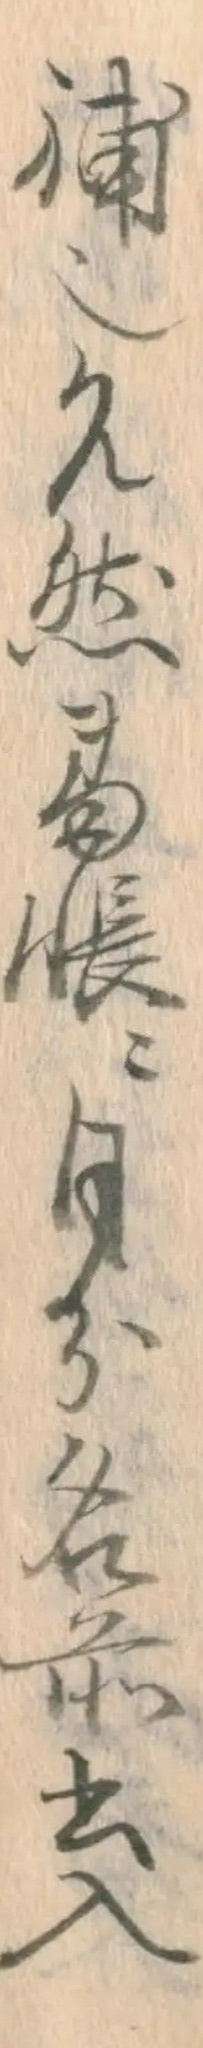補也乍然番帳ニ自分名前書入
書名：賀茂社記録. 第81冊
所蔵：国立国会図書館 National Diet Library, JAPAN
